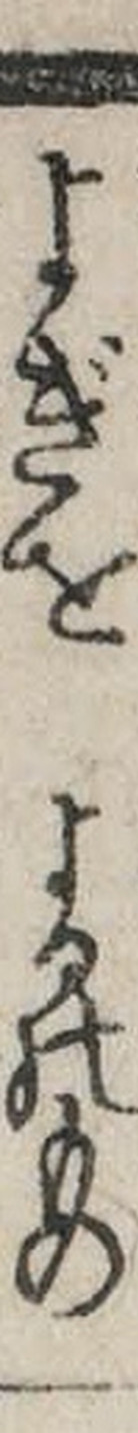よぎをよるのもの
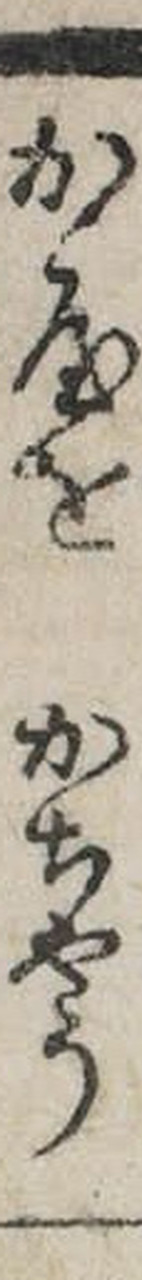かやをかちやう
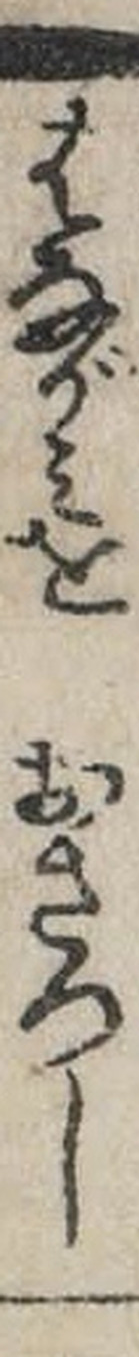はながみをおさつし
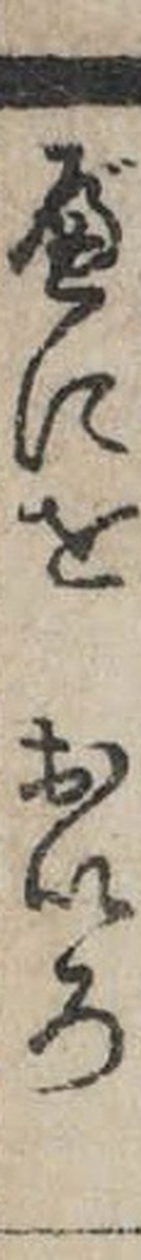べにをおいろ
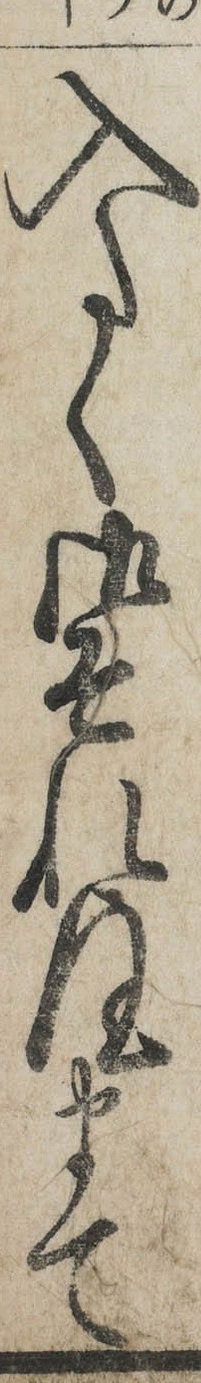入たく御それさままて

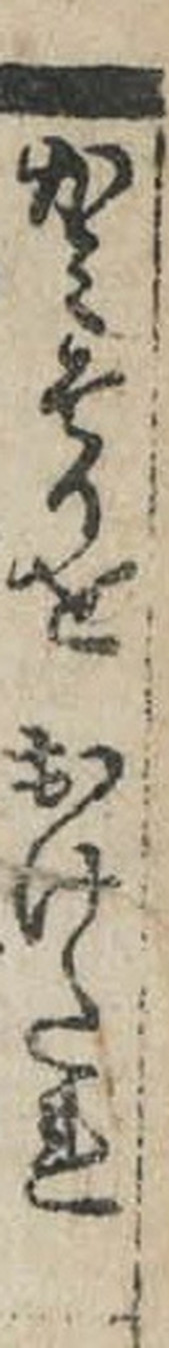かみそりをおけたれ
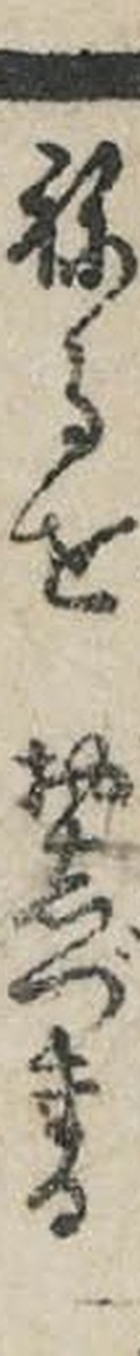ねるをおしづまる
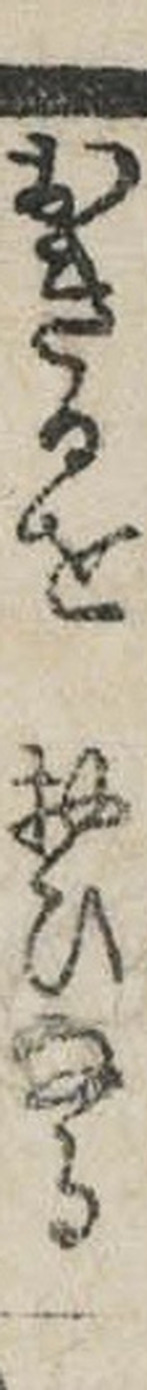おきるをおひなる
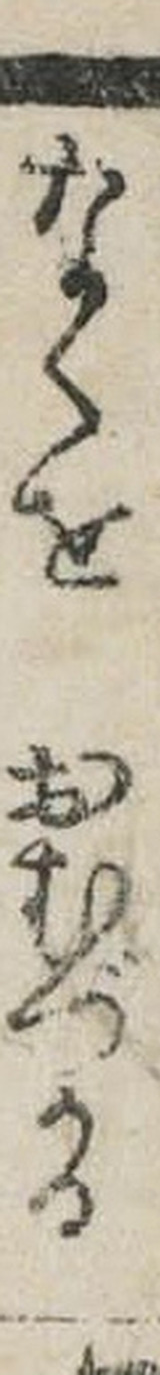なくをおむづかる
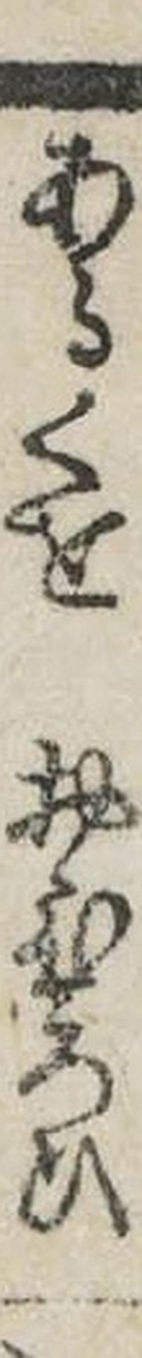あるくをおひろひ
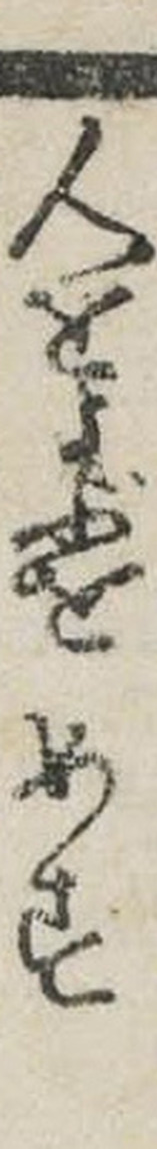人をよぶをめす
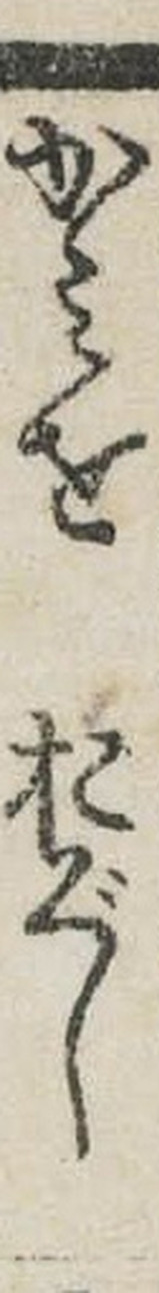かみをおぐし
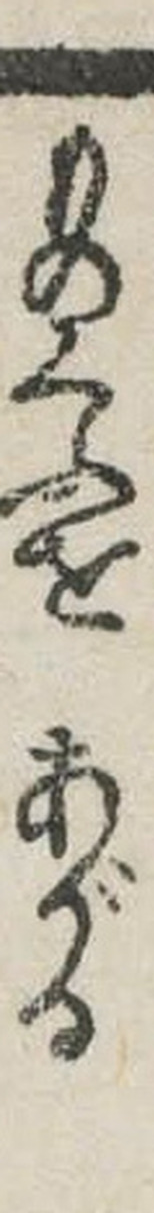ものくふをあがる
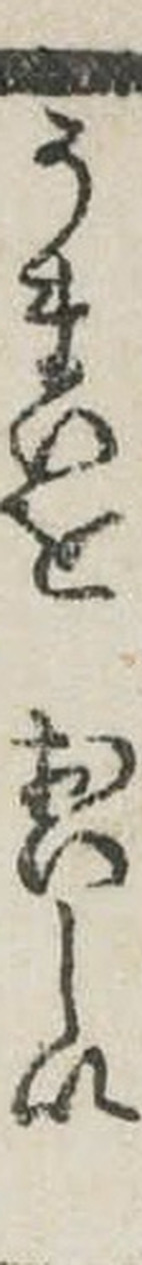うまいをおいしい
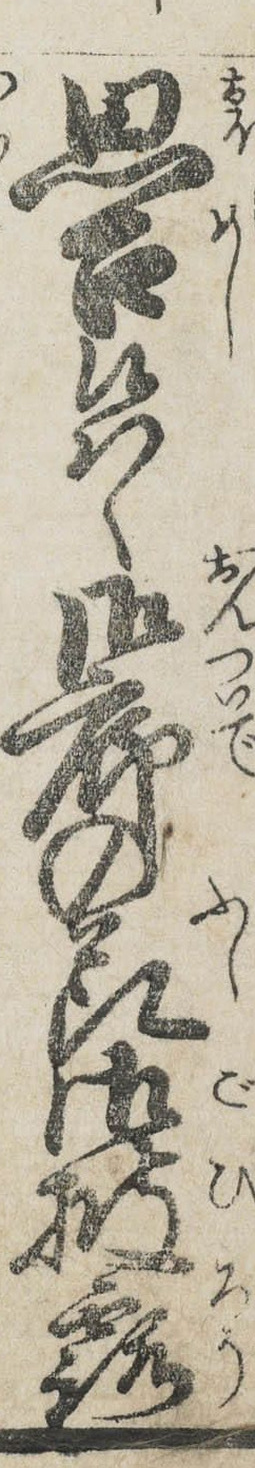思召候はゝ御序の節御披露
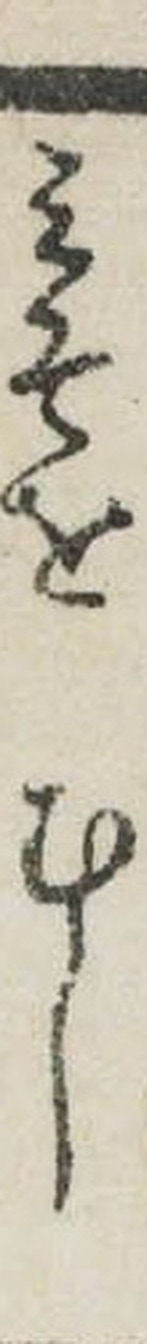みそをむし
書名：頭書萬用婦人手紙之文言
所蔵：東京学芸大学教育コンテンツアーカイブ
